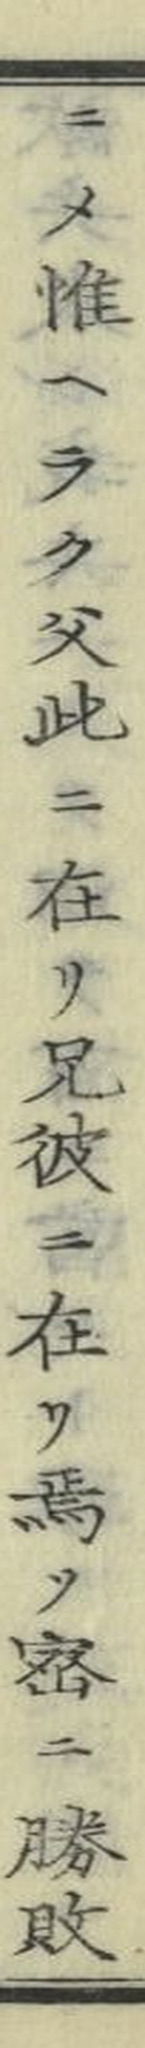ニシテ惟ヘラク父此ニ在リ兄彼ニ在リ焉ソ勝敗
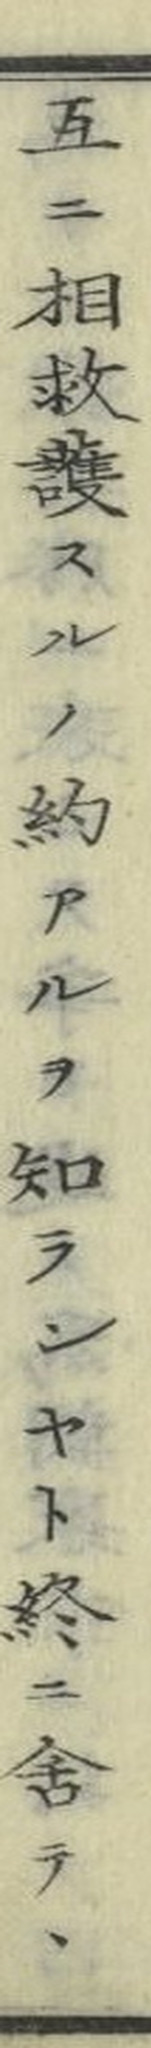互ニ相救護スルノ約アルヲ知ランヤト終ニ舍テヽ
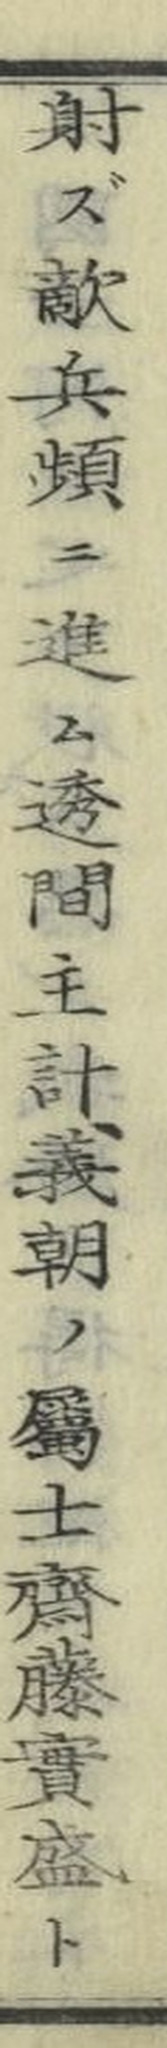射ズ歒兵頻ニ進ム透間主計、義朝ノ屬士齋藤實盛ト
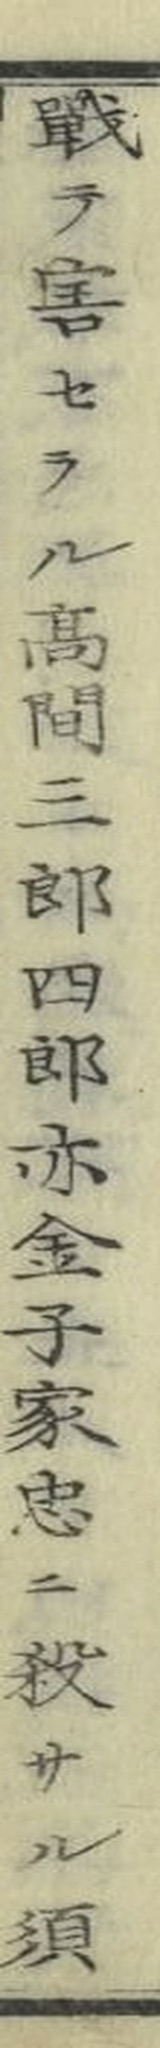戰ヲ害セラル髙間三郎四郎亦金子家忠ニ殺サル須

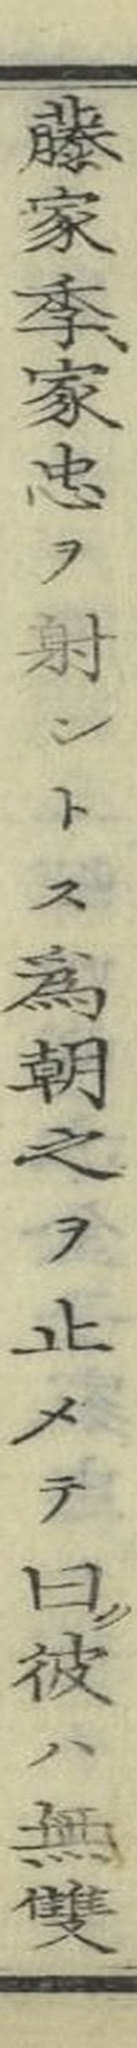藤家李、家忠ヲ射ントス爲朝之ヲ止メテ曰彼ハ無雙
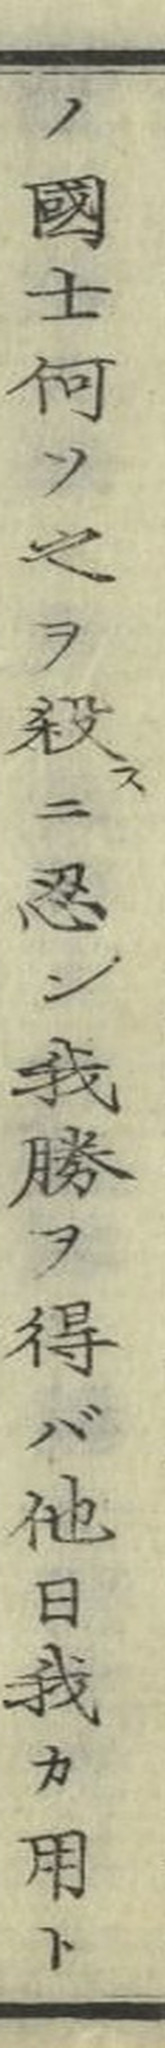ノ國士何ソ之ヲ殺ニ忍ン我勝ヲ得バ他日我カ用ト
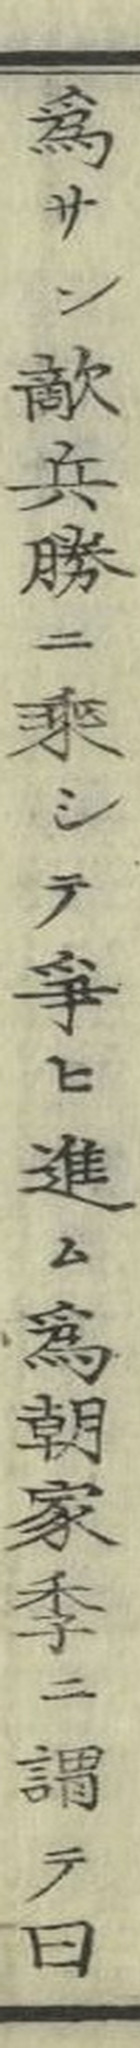爲サン歒兵勝ニ乘シテ爭ヒ進ム爲朝家季ニ謂テ曰
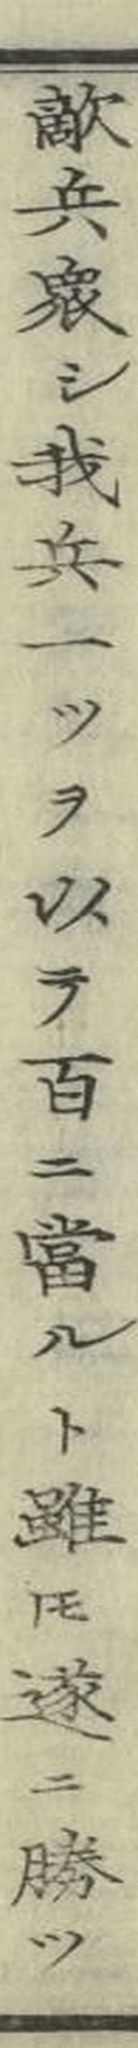歒兵衆シ我兵一ツヲ以テ百ニ當ルト雖トモ遂ニ勝ツ
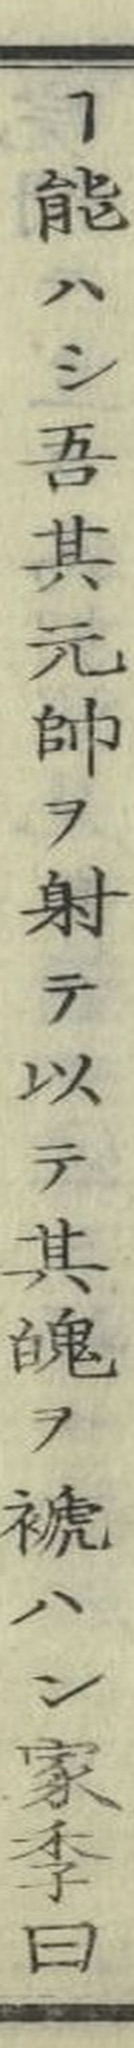コト能ハシ吾其元帥ヲ射テ以テ其魄ヲ褫ハン家李曰
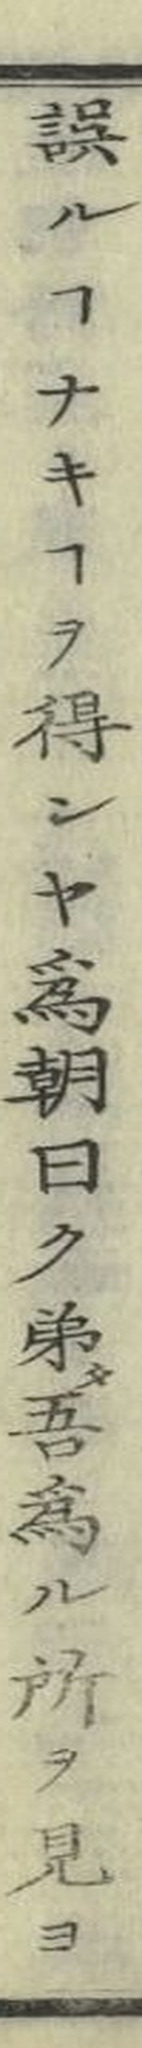誤ルコトナキコトヲ得ンヤ爲朝曰ク弟吾爲ル所ヲ見ヨ
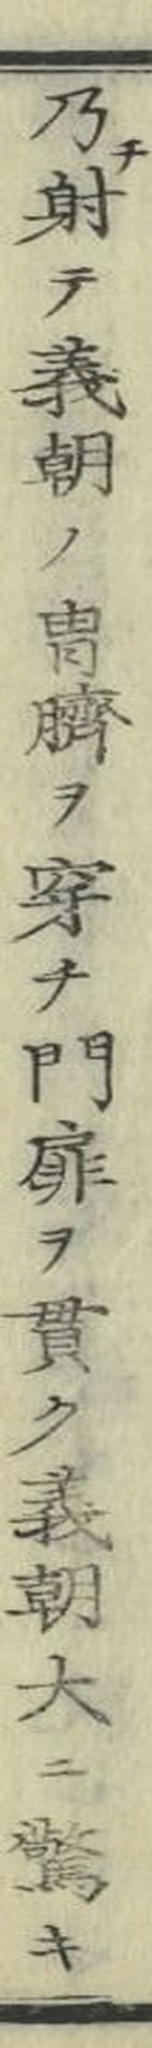乃射テ義朝ノ冑臍ヲ穿チ門扉ヲ貫ク義朝大ニ驚キ
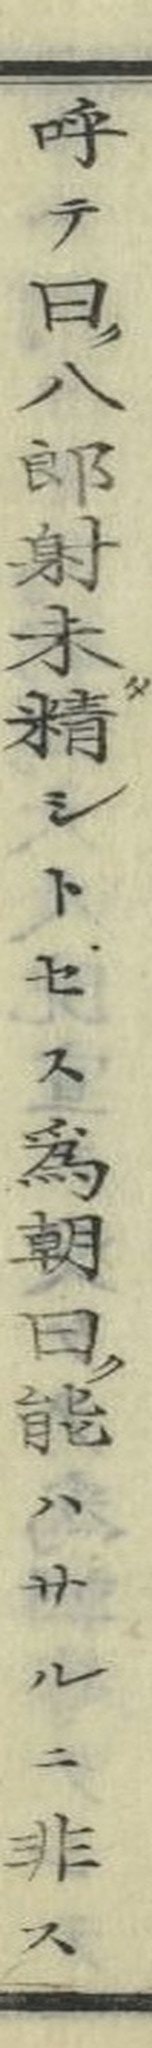呼テ曰八郎射未精シトセス爲朝曰能ハサルニ非ス
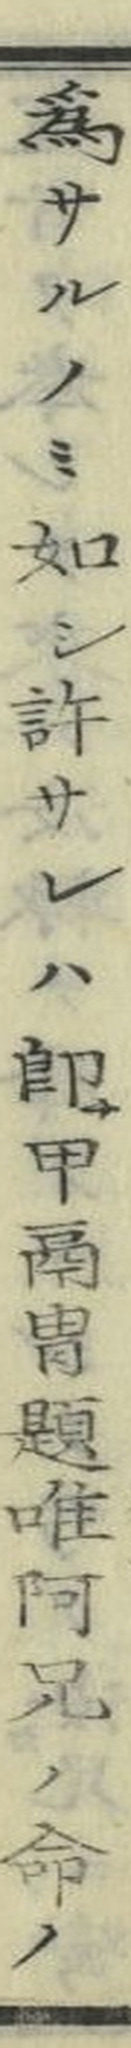爲サルノミ如シ許サレハ即チ甲鬲冑題唯、阿兄ノ命ノ
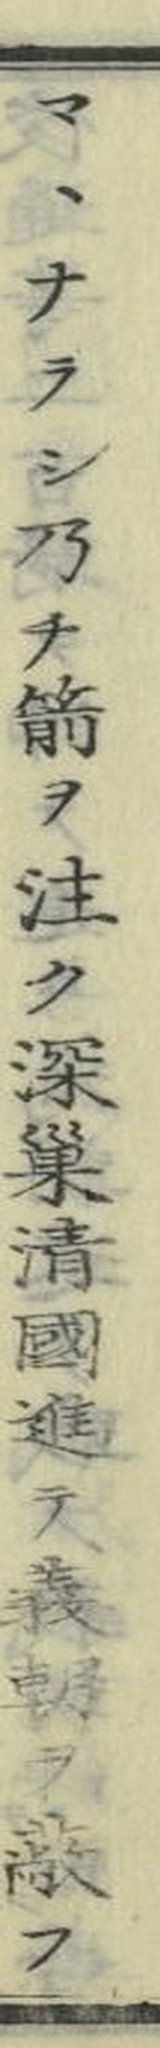マヽナラシ乃チ箭ヲ注ク深巢清國進テ義朝ヲ蔽フ
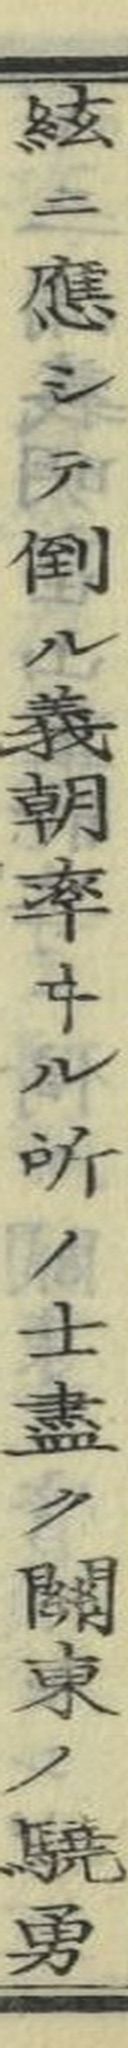絃ニ應シテ倒ル義朝率ヰル所ノ士盡ク關東ノ驍勇
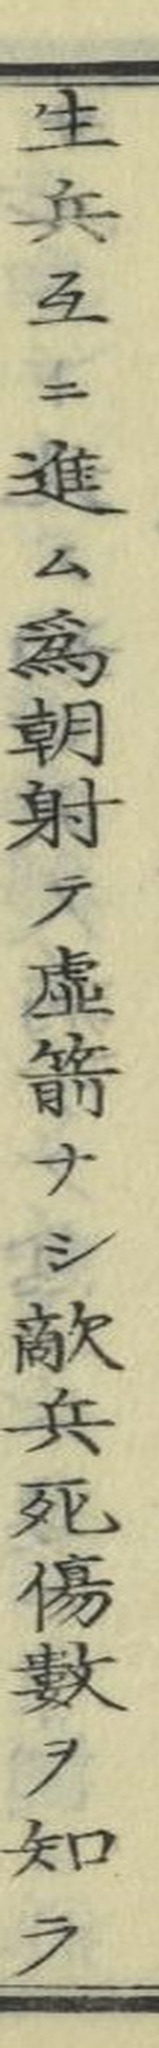生兵互ニ進ム爲朝射テ虛箭ナシ歒兵死傷數ヲ知ラ
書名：琉球藩史 一之巻
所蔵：University of the Ryukyus Library
